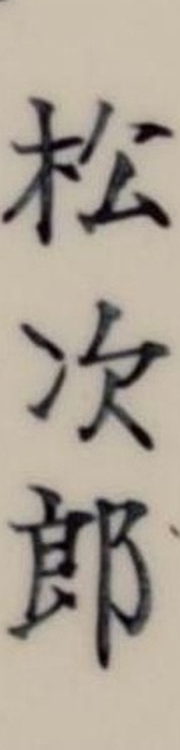松次郎
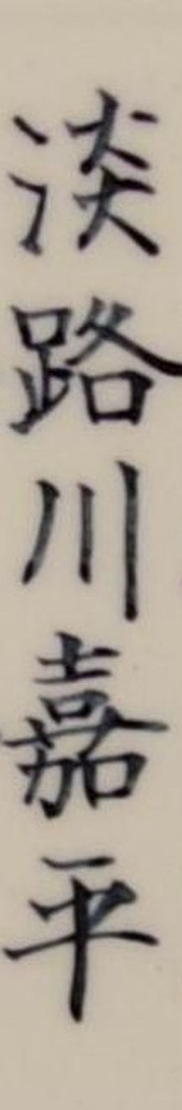淡路川嘉平
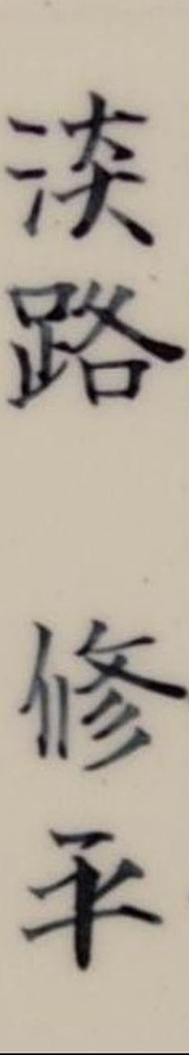淡路修平
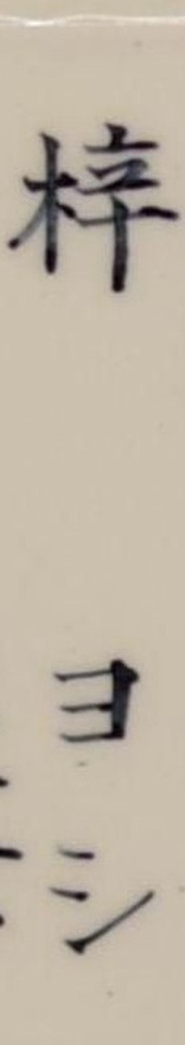梓ヨシ
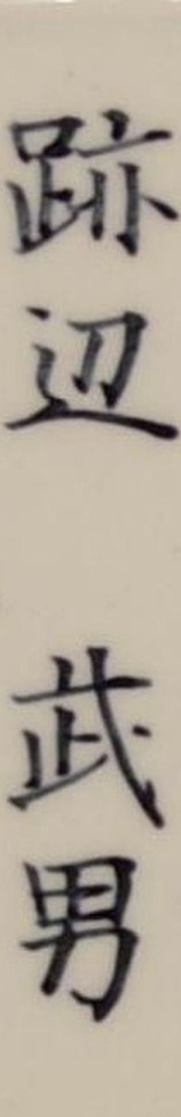跡辺武男
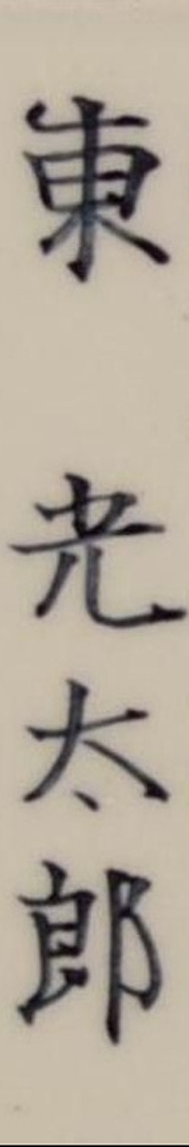東光太郎
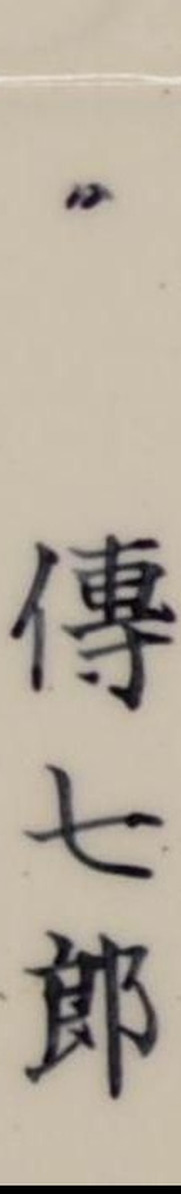傳七郎
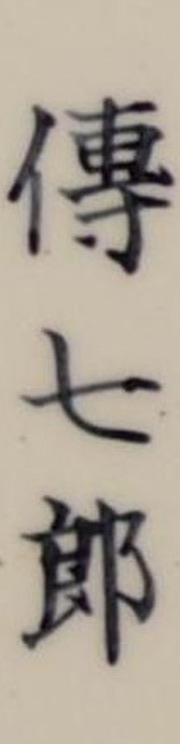傳七郎
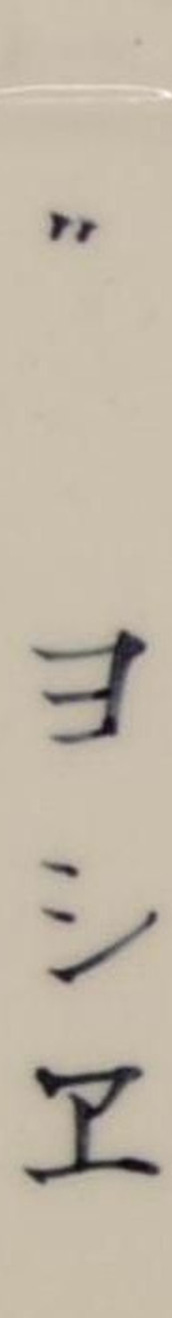ヨシエ
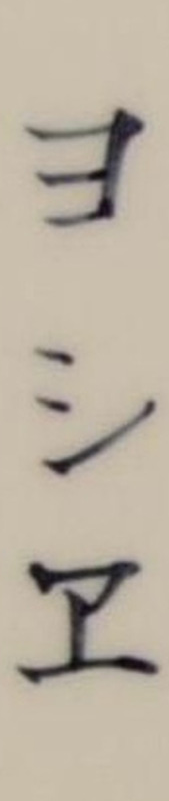ヨシエ
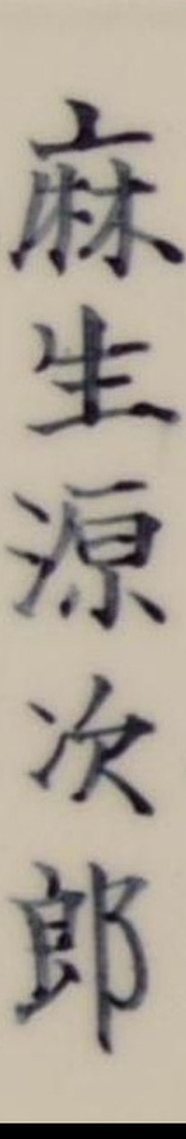麻生源次郎
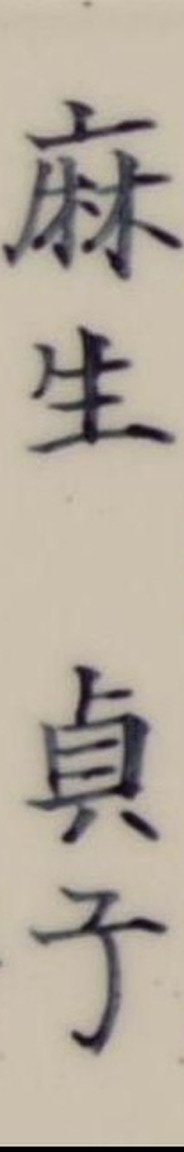麻生貞子

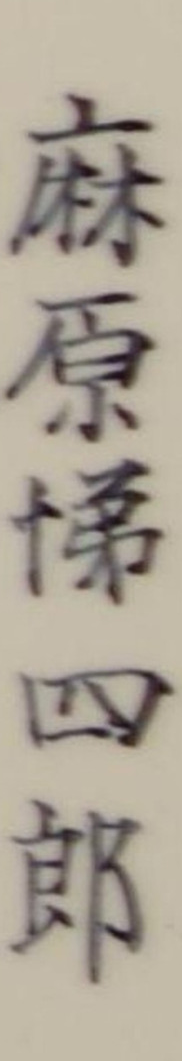麻原悌四郎
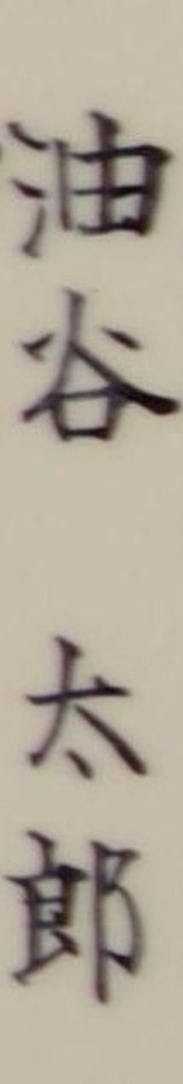油谷太郎
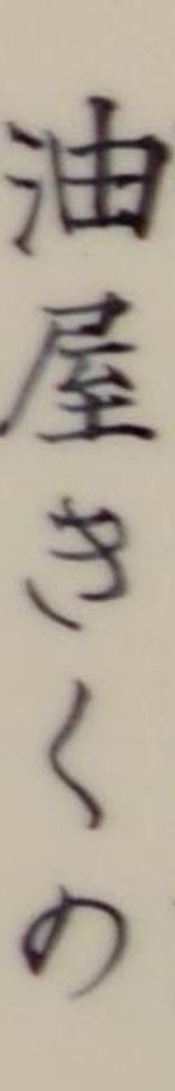油屋きくの
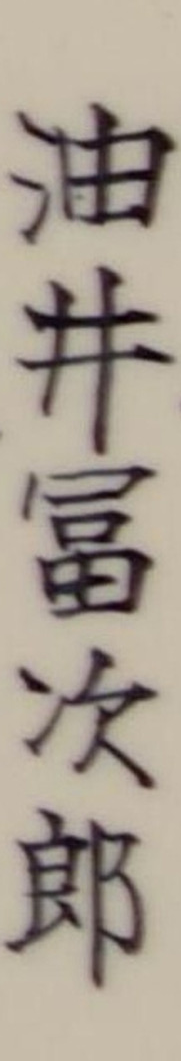油井冨次郎
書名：E~L
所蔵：高野山金剛峯寺
